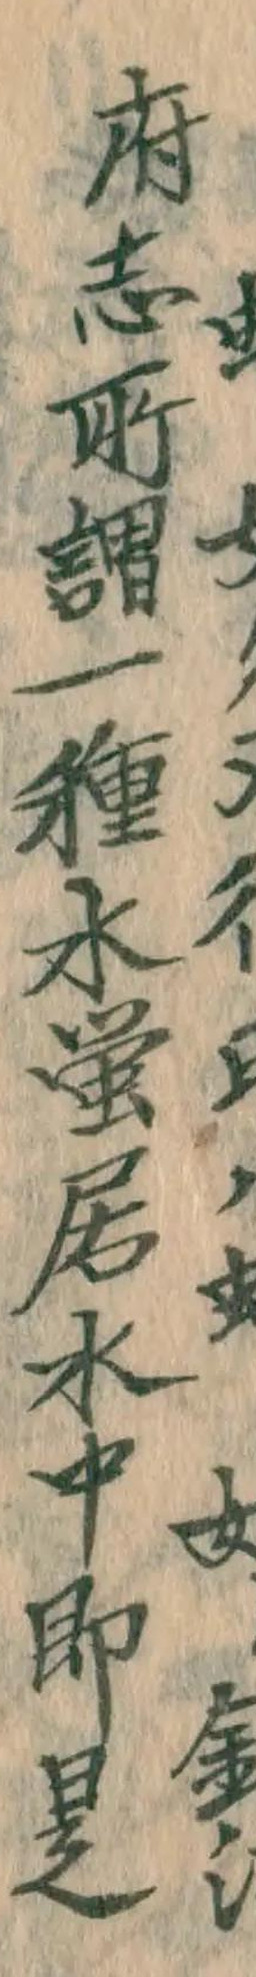府志所謂一種水蛍居水中即是
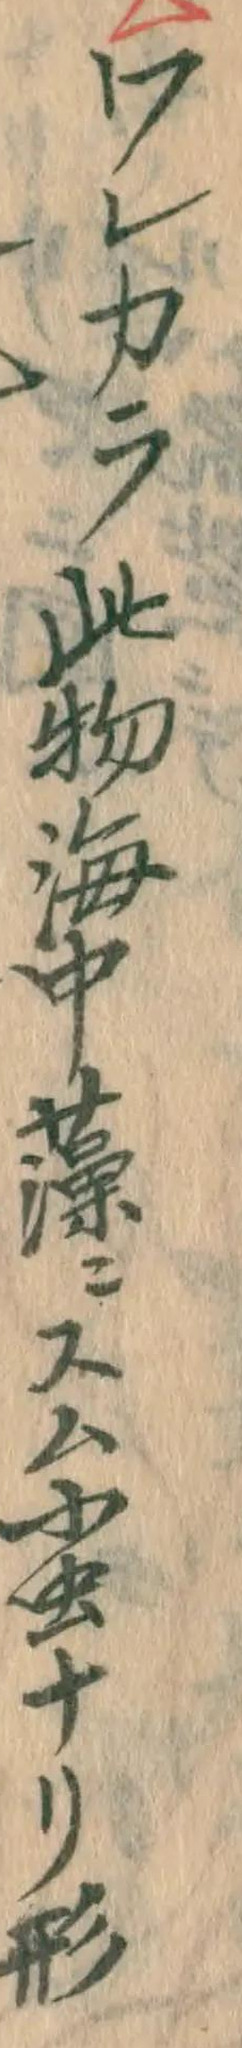△ワレカラ此物海中藻ニスム小虫ナリ形
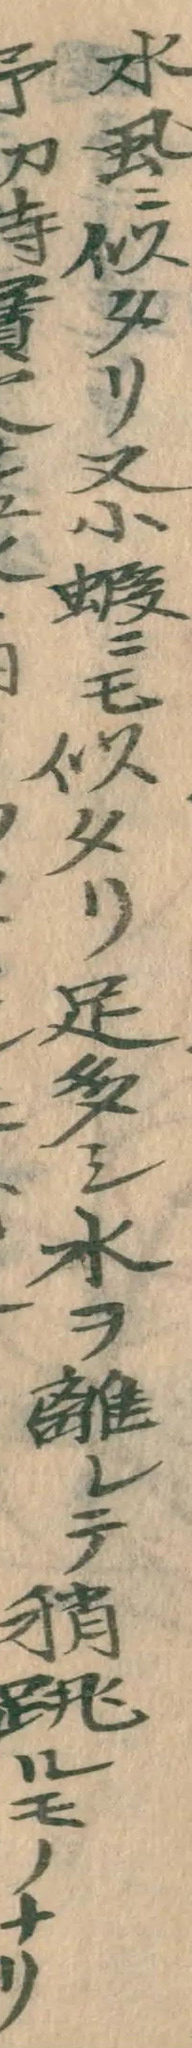水虱ニ似タリ又小蝦ニモ似タリ足多シ水ヲ離レテ稍跳ルモノナリ
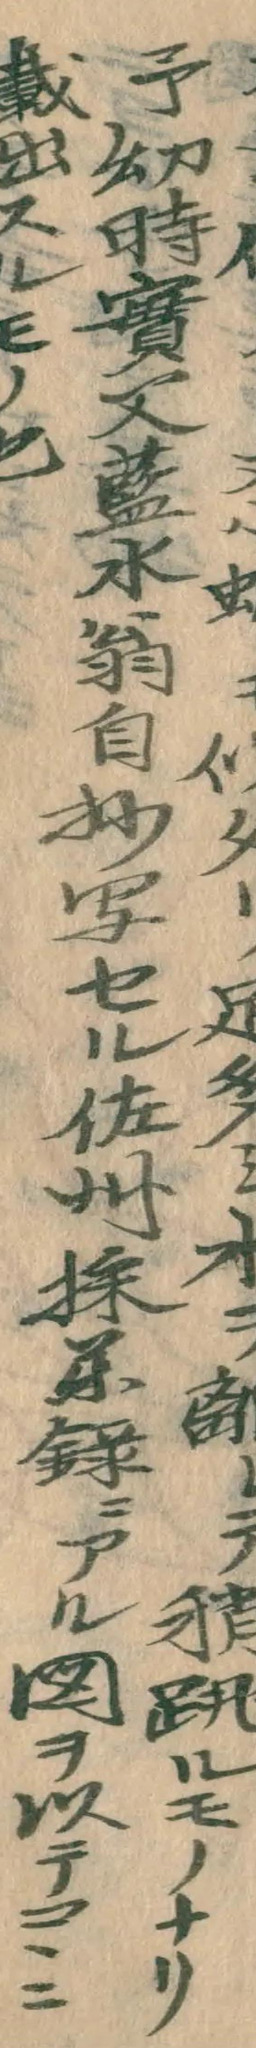予幼時實父藍水翁自抄写セル佐州際採薬録ニアル図ヲ以テコヽニ
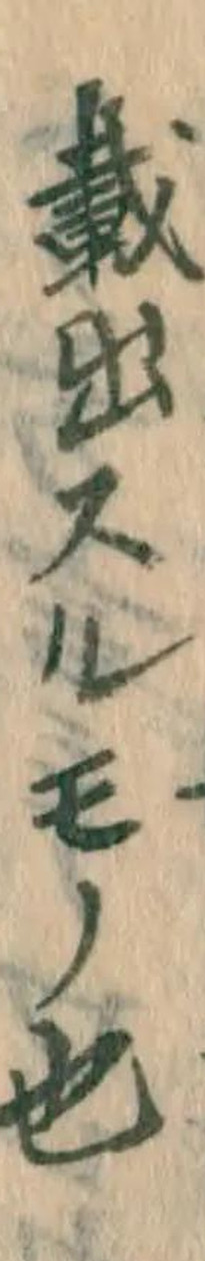載出スルモノ也

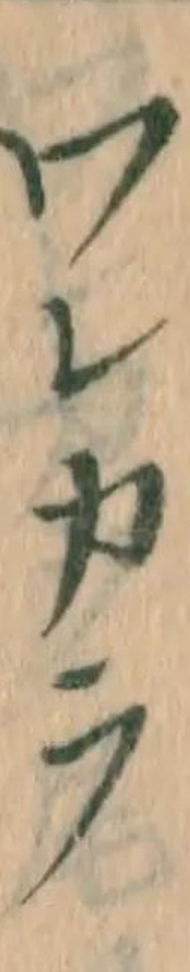ワレカラ
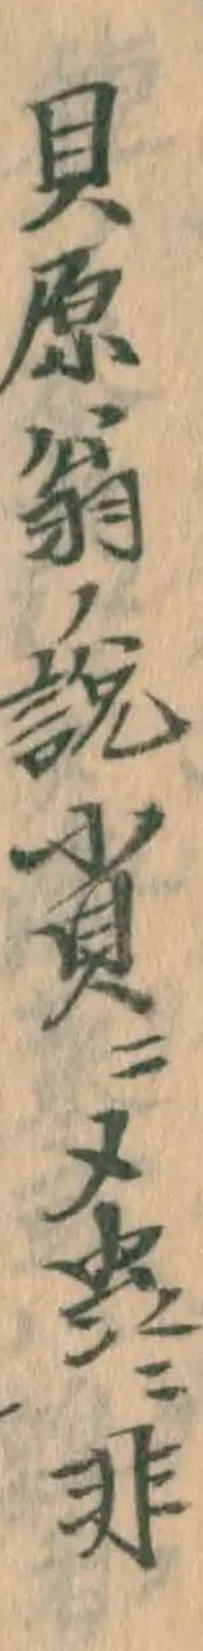貝原翁ノ説小貝ニシテ蟲ニ非
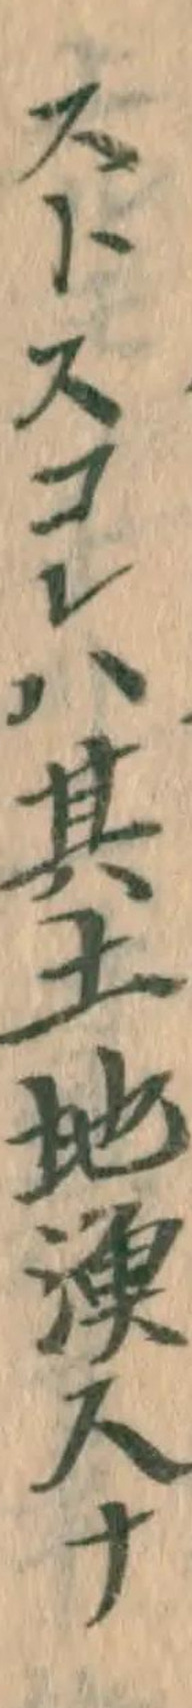ストスコレハ其土地漁人ナ
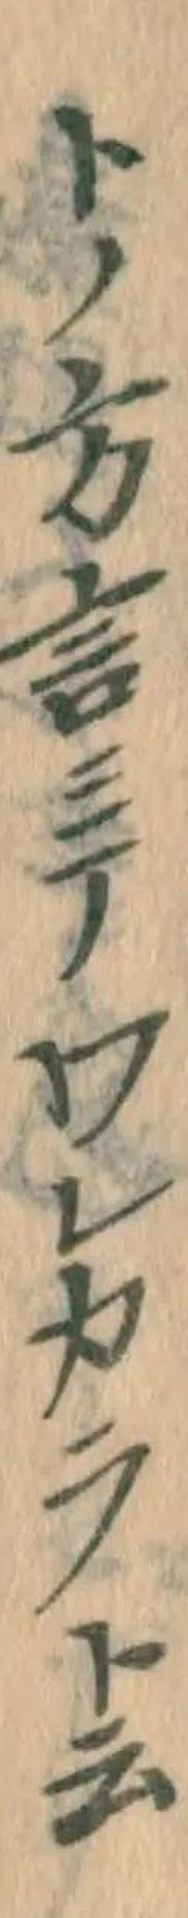トノ方言ニテワレカラト云
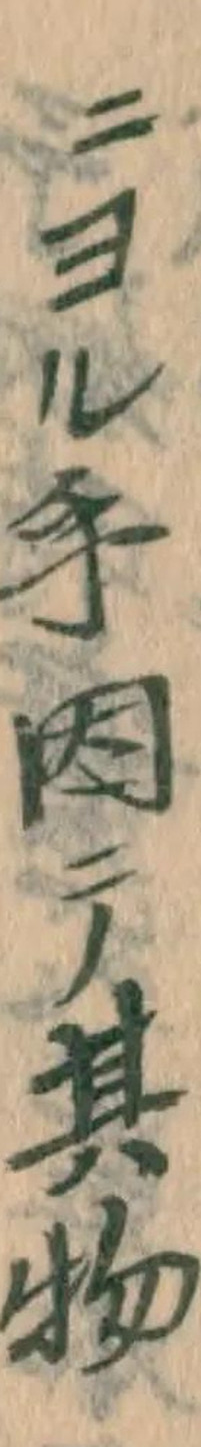ニヨル乎因テ其物
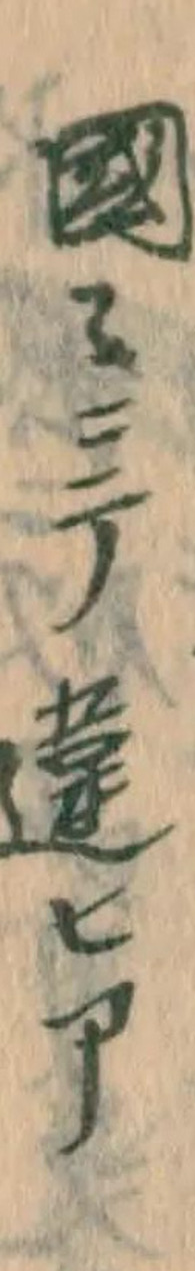國々ニテ違ヒア
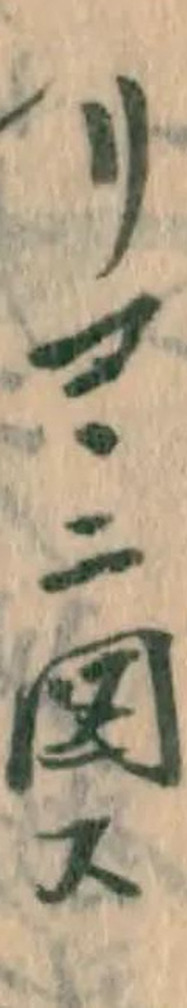リコヽニ図ス
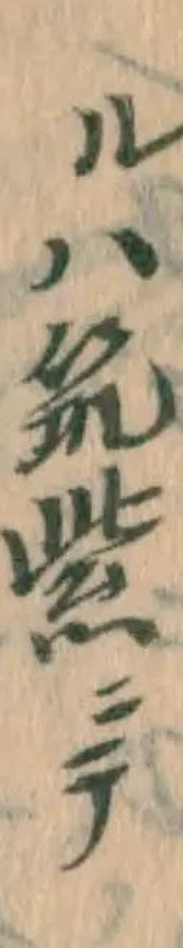ルハ筑紫ニテ
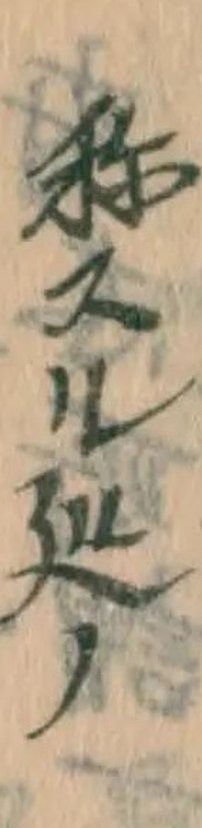称スル処ノ
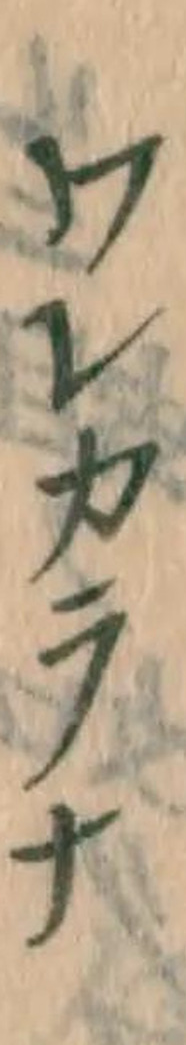ワレカラナ
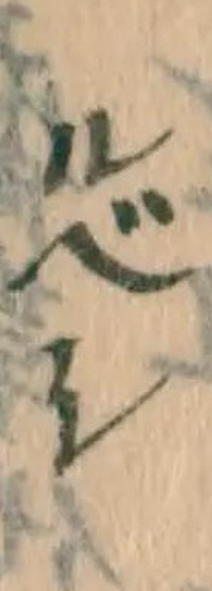ルベシ
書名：千蟲譜 3巻. [1]
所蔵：国立国会図書館 National Diet Library, JAPAN
